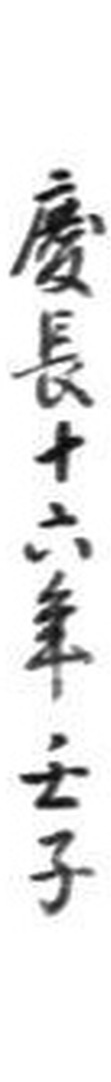慶長十六年壬子
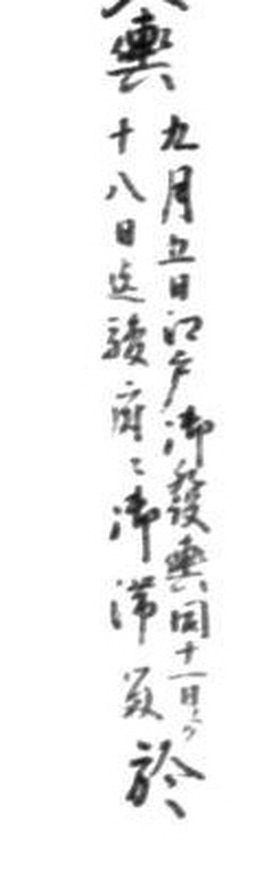十八日迄駿府ニ御滞留於
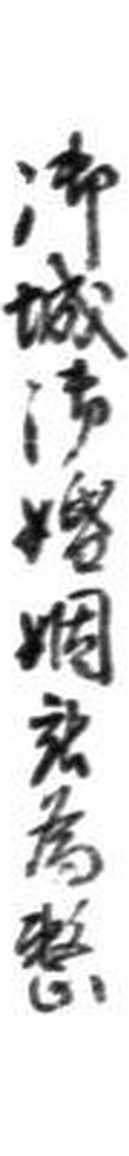御城御婚姻被為整

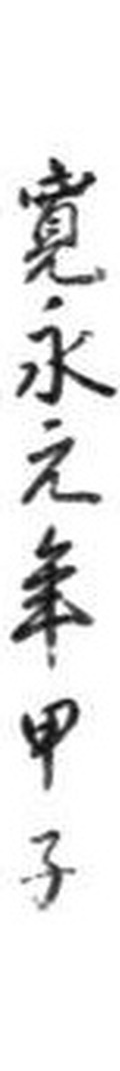寛永元年甲子
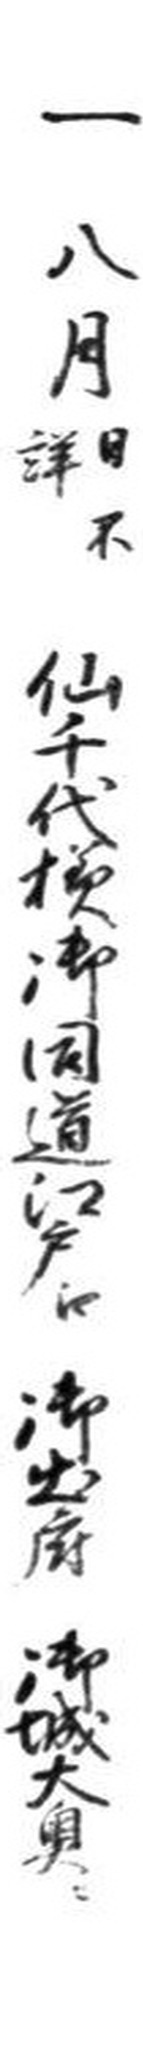詳仙千代様御同道江戸江御出府御城大奥ニ
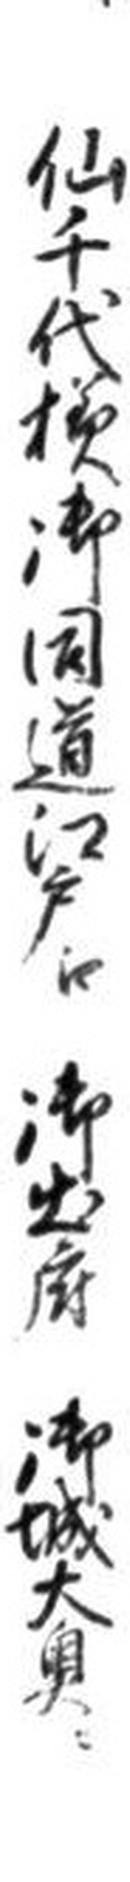詳仙千代様御同道江戸江御出府御城大奥ニ
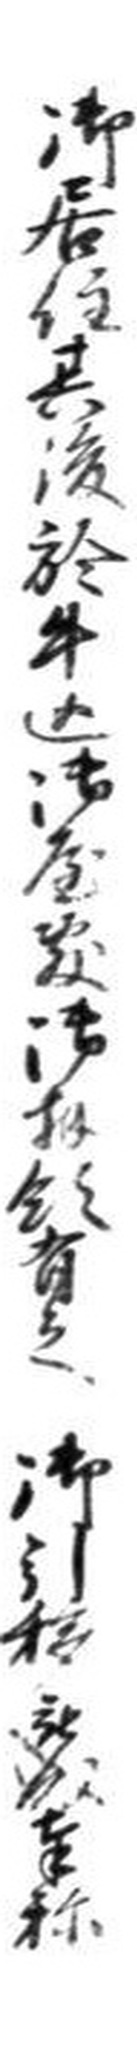御居住其後於牛込御屋敷御拝領有之御引移被成奉称
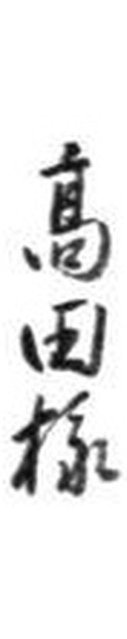高田様
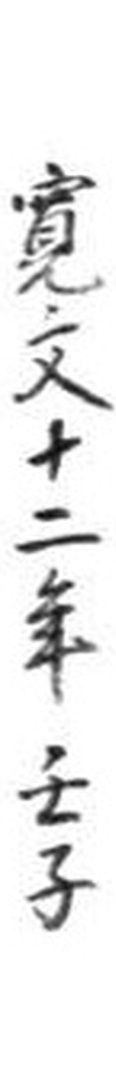寛文十二年壬子
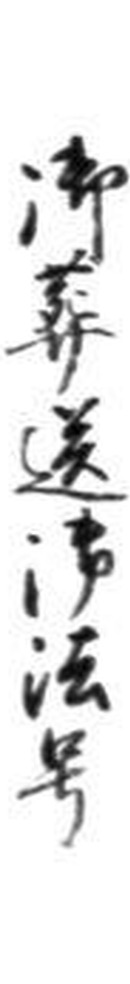御葬送御法号
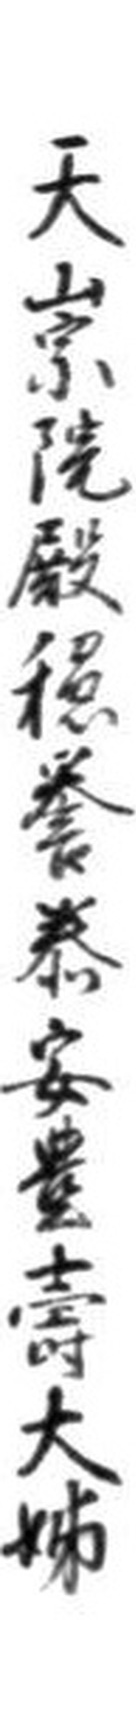天崇院殿穏誉泰安豊寿大姉
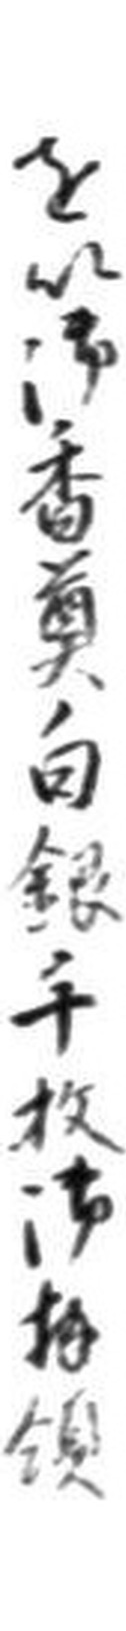を以御香奠白銀千枚御拝領
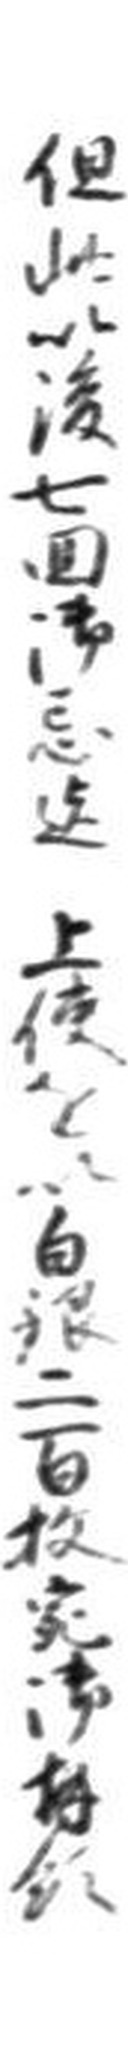但此以後七回御忌迄上使を以白銀二百枚宛御拝領

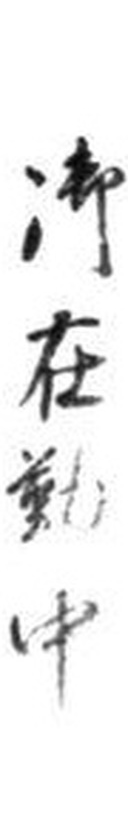御在勤中
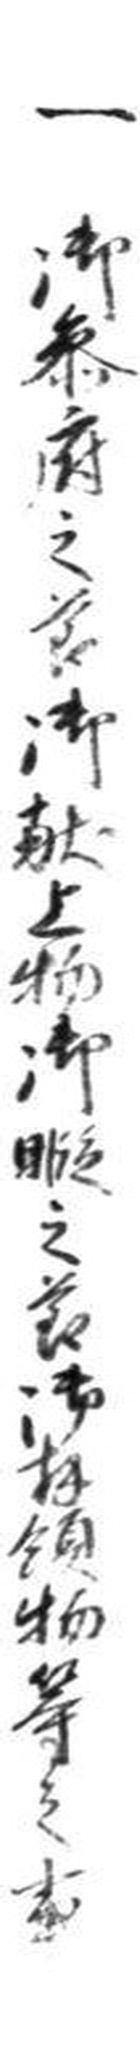一御参府之節御献上物御暇之節御拝領物等之事
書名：家譜 二 忠直公 従文禄四年到慶安四年
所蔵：福井県文書館 Fukui Prefectural Archives
